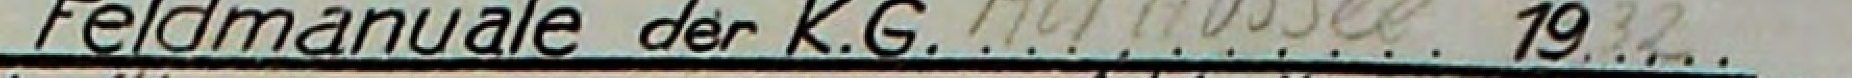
Feldmanuale der K.G. Alt Aussee 1932
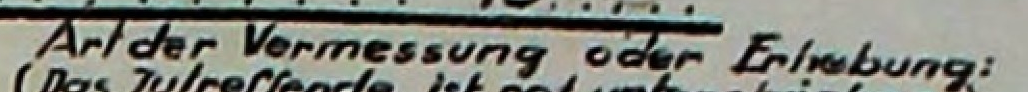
Art der Vermessung oder Erhebung:
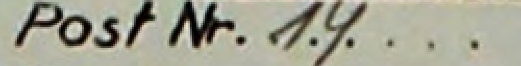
Post Nr. 14
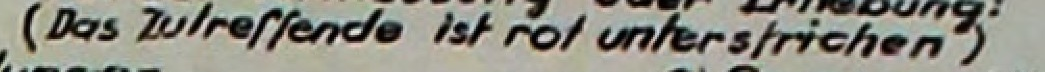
(Das Zutreffende ist rot unterstrichen)
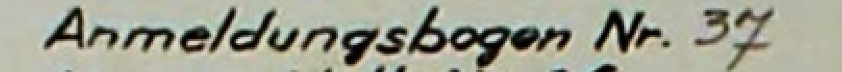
Anmeldungsbogen Nr. 37
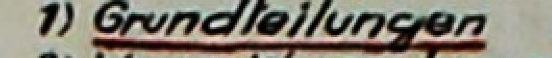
1) Grundteilungen
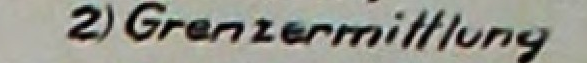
2) Grenzermittlung
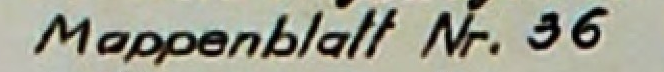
Mappenblatt Nr. 36
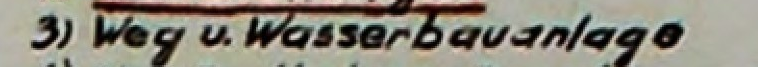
3) Weg u. Wasserbauanlage
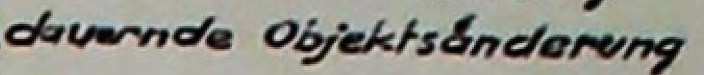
dauernde Objektsänderung
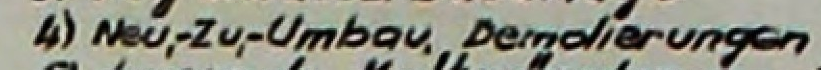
4) Neu,-Zu,- umbau, Demolierungen
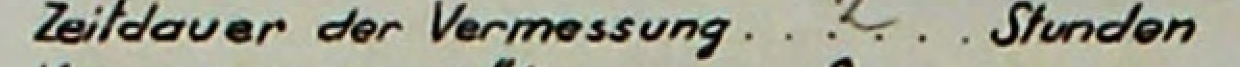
Zeitdauer der Vermessung 2 Stunden
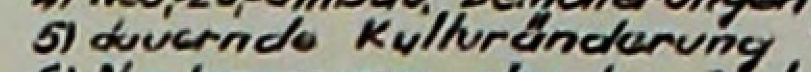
5) dauernde Kulturänderung
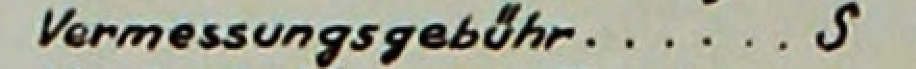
Vermessungsgebühr S
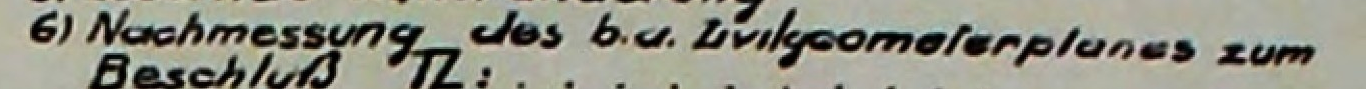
6) Nachmessung des b.a. Civilgeometerplanes zum
